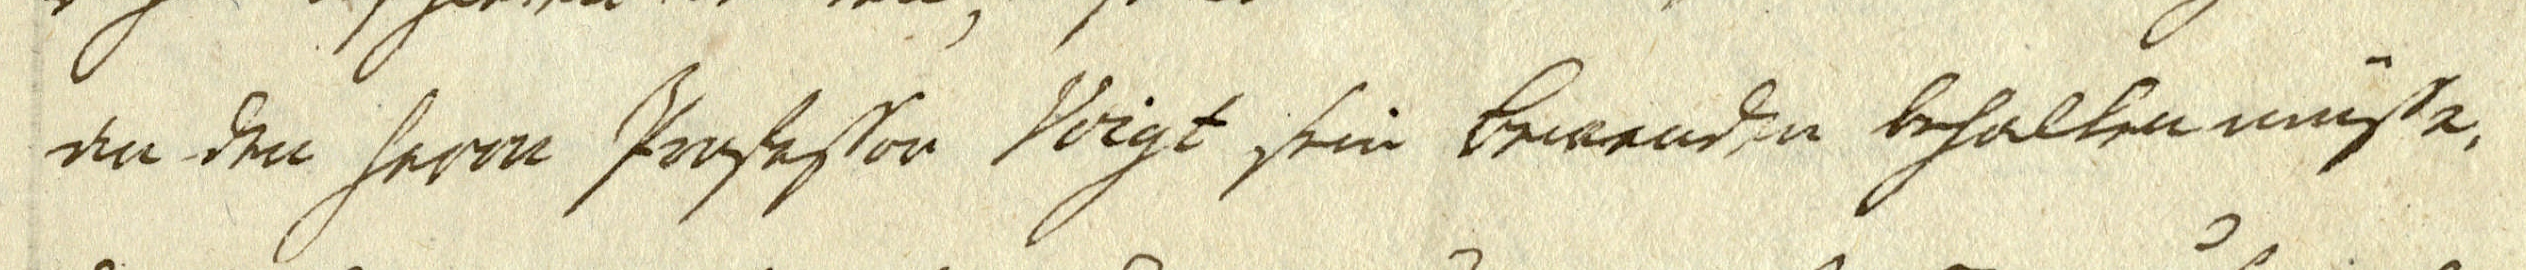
an den Herrn Professor Voigt sein Bewenden behalten müsse,
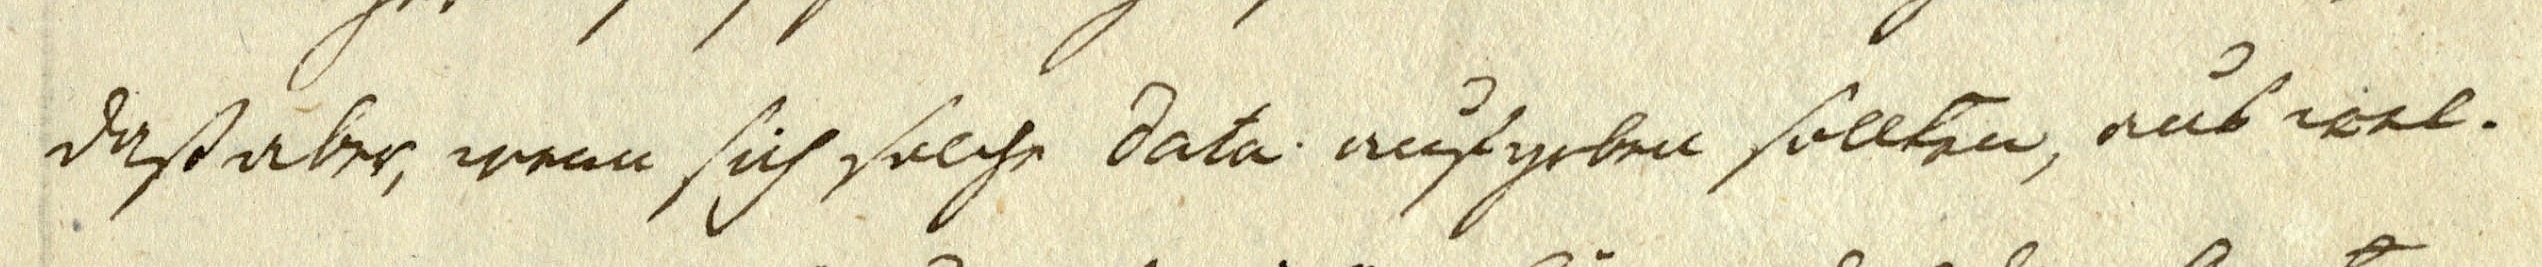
daß aber, wenn sich solche data aufgeben sollten, aus wel¬
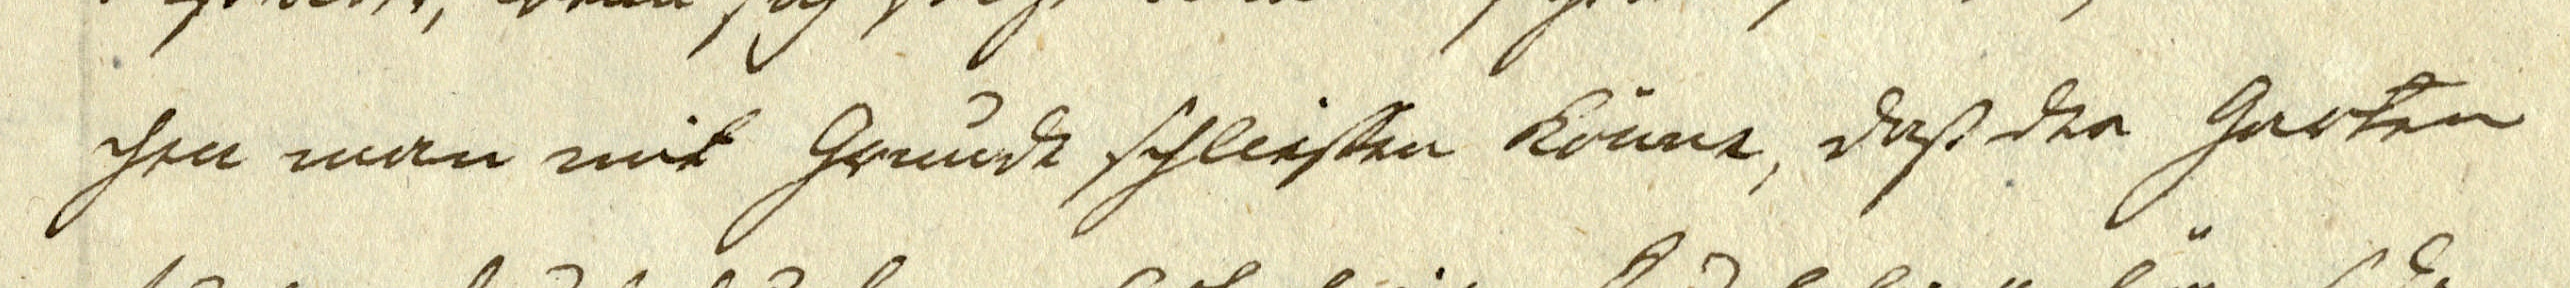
chen man mit Grunde schliessen könne, daß der Garten
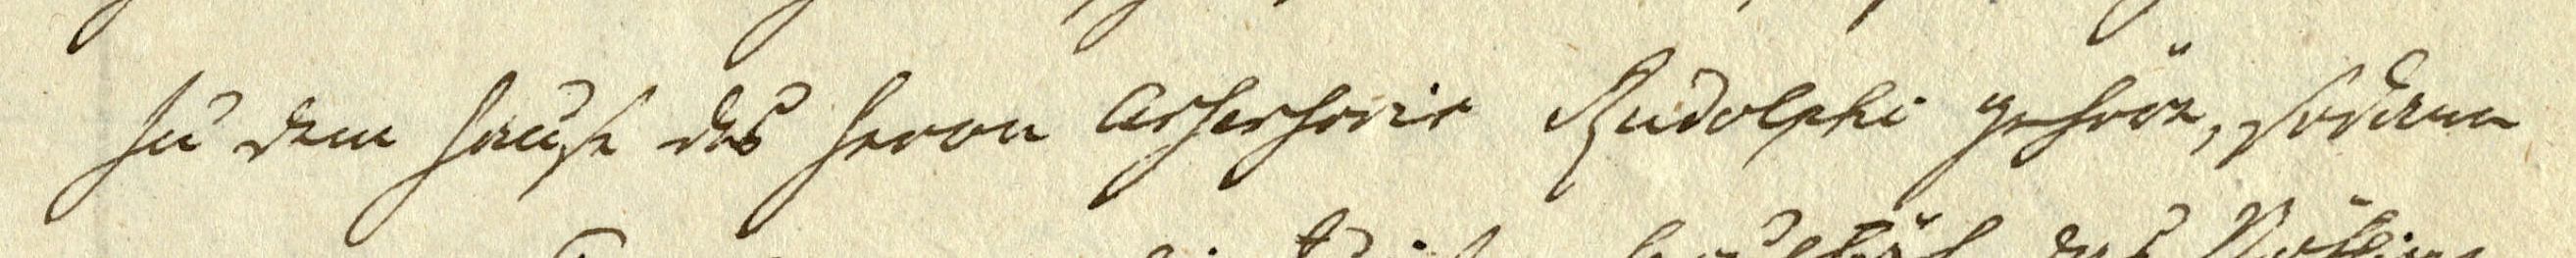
zu dem Hause des Herrn Assessoris Rudolphi gehöre, sodann
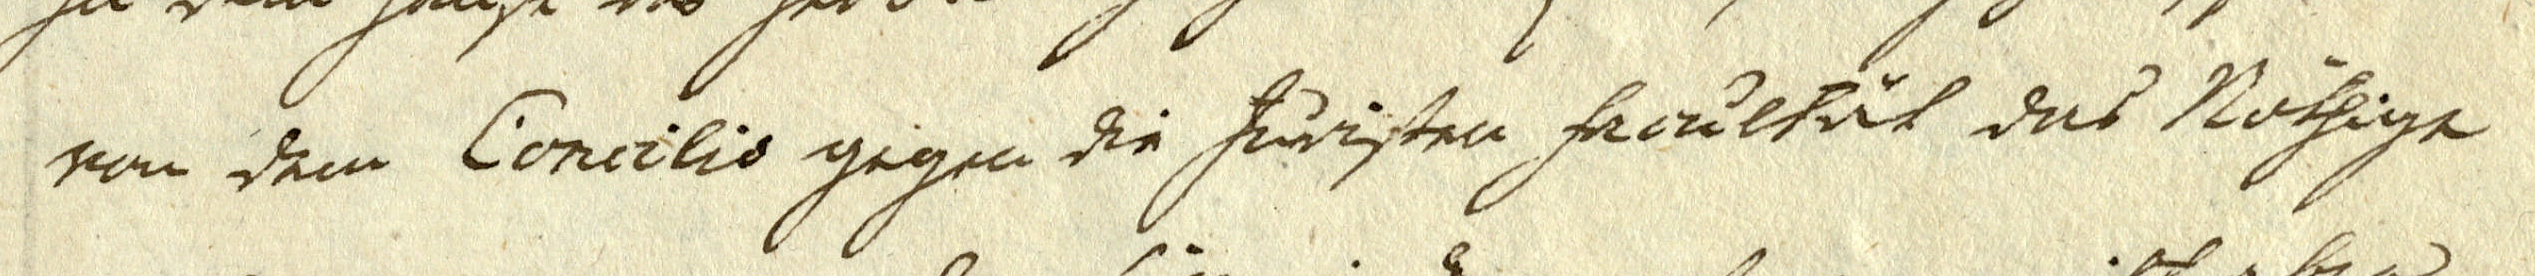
von dem Concilio gegen die Juristen Facultät das Nöthige
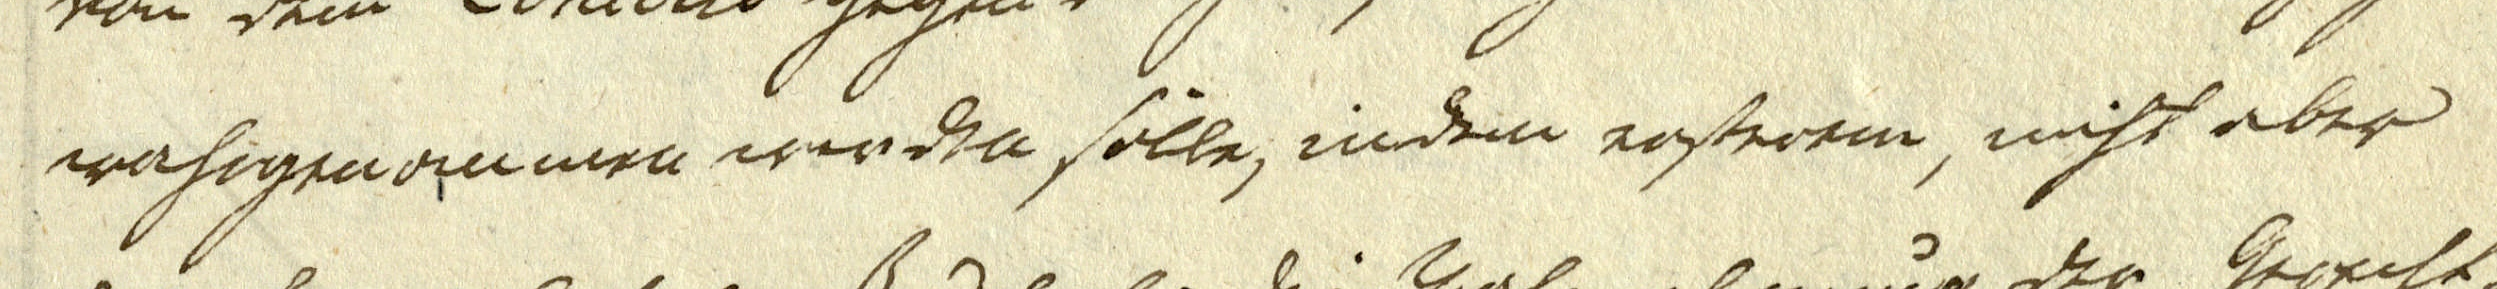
wahrgenommen werden solle, indem ersterem, nicht aber
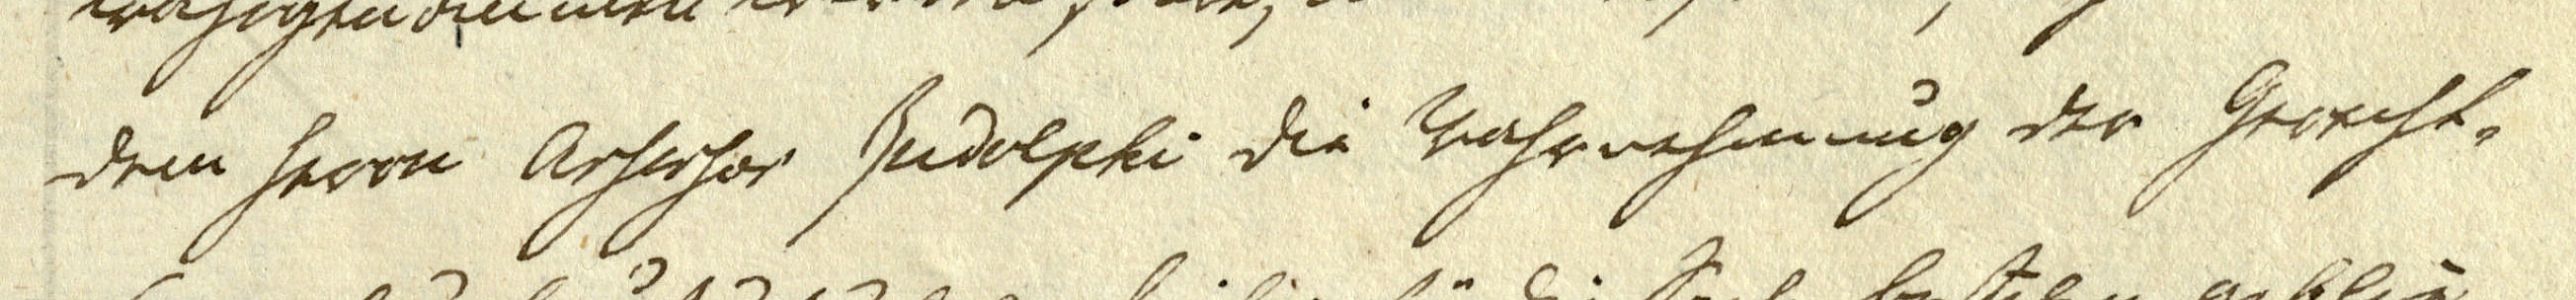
dem Herrn Assessor Rudolphi die Wahrnehmung der Gerecht¬
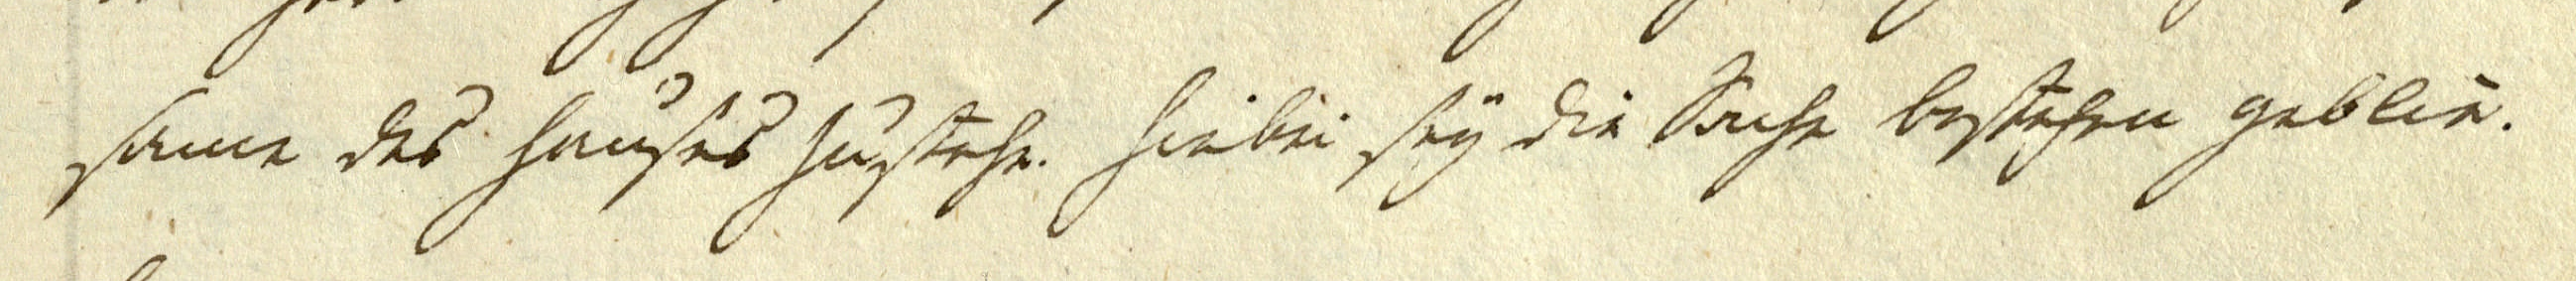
same des Hauses zustehe. Hiebei seÿ die Sache bestehen geblie¬
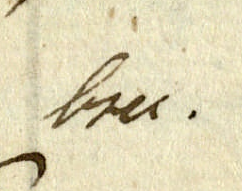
ben.
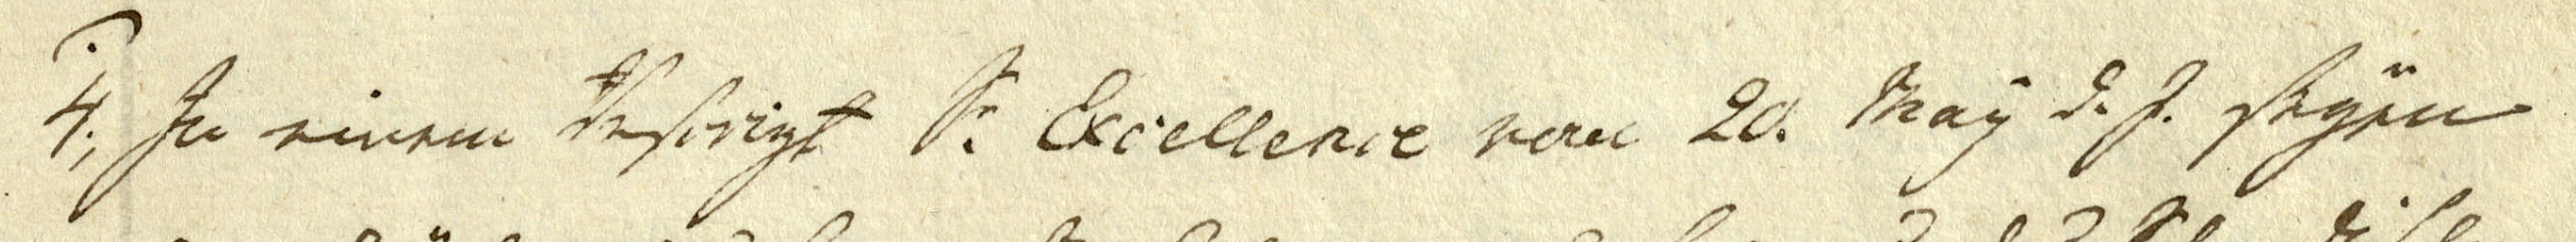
4., In einem Rescript Sr Excellence vom 20. Maÿ d. J. seÿen
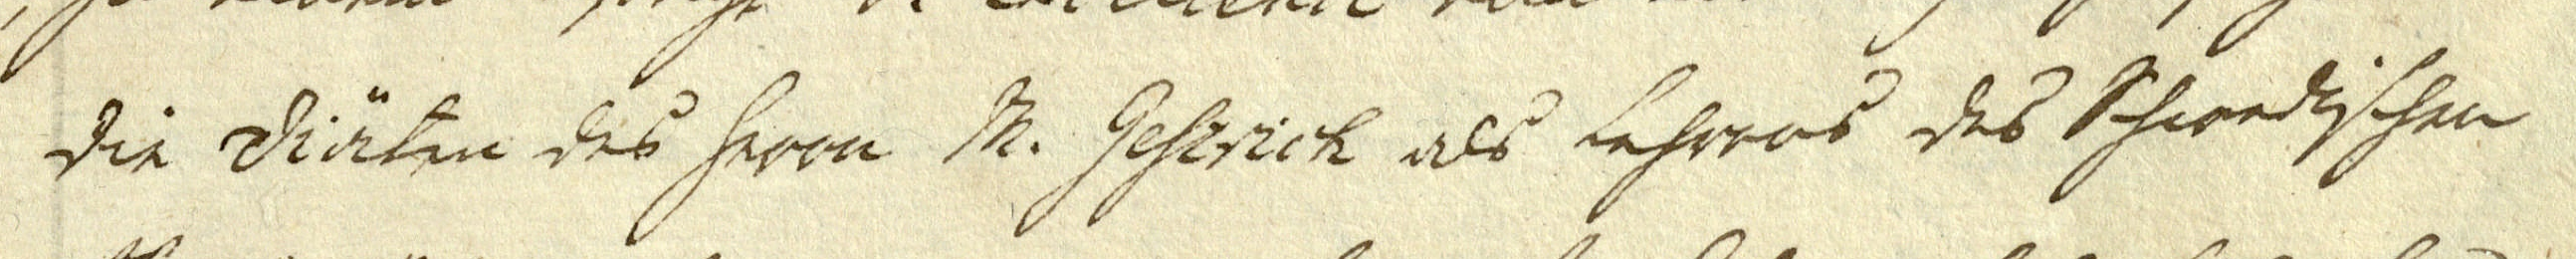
die Diäten des Herrn M. Gestrich als Lehrers des Schwedischen
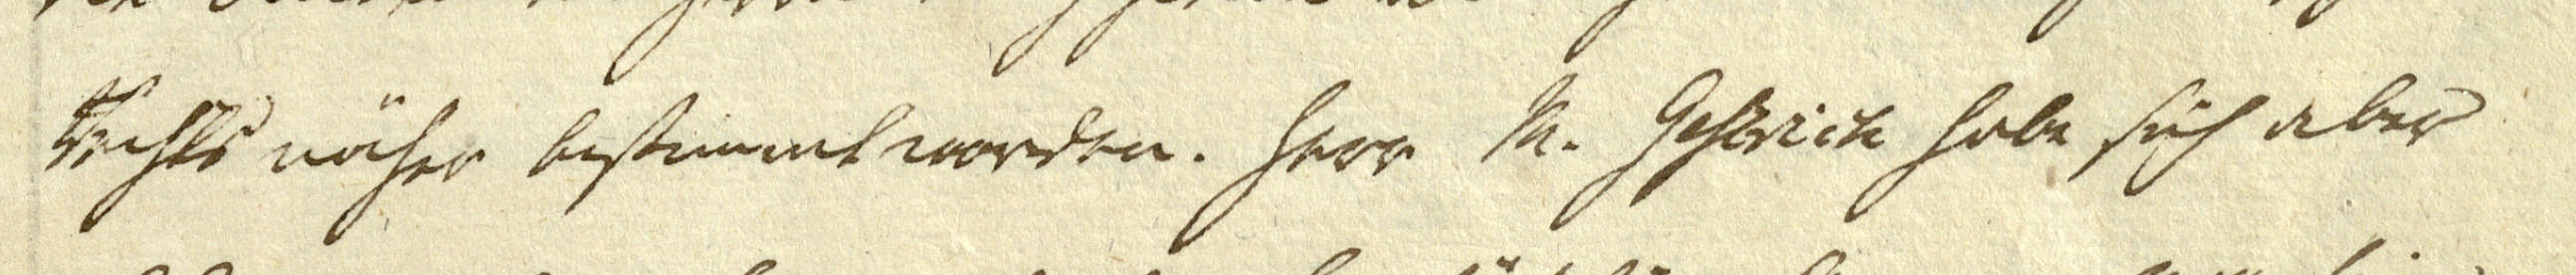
Rechts näher bestimmt worden. Herr M. Gestrich habe sich aber
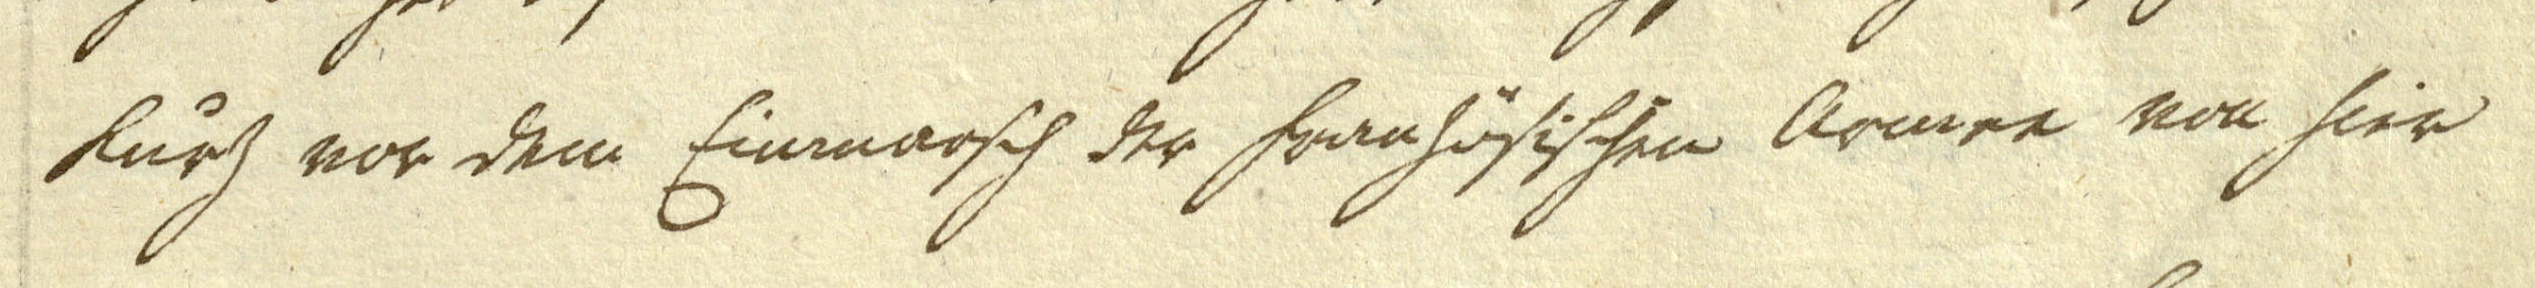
kurz vor dem Einmarsch der Französischen Armee von hier
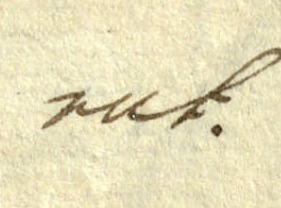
ent¬
